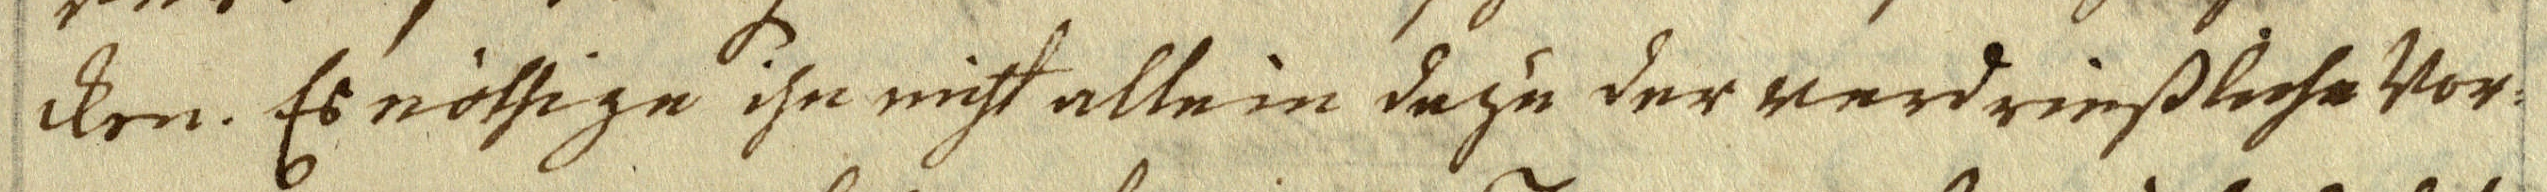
cken. Es nöthige ihn nicht allein dazu der verdrießliche Vor¬
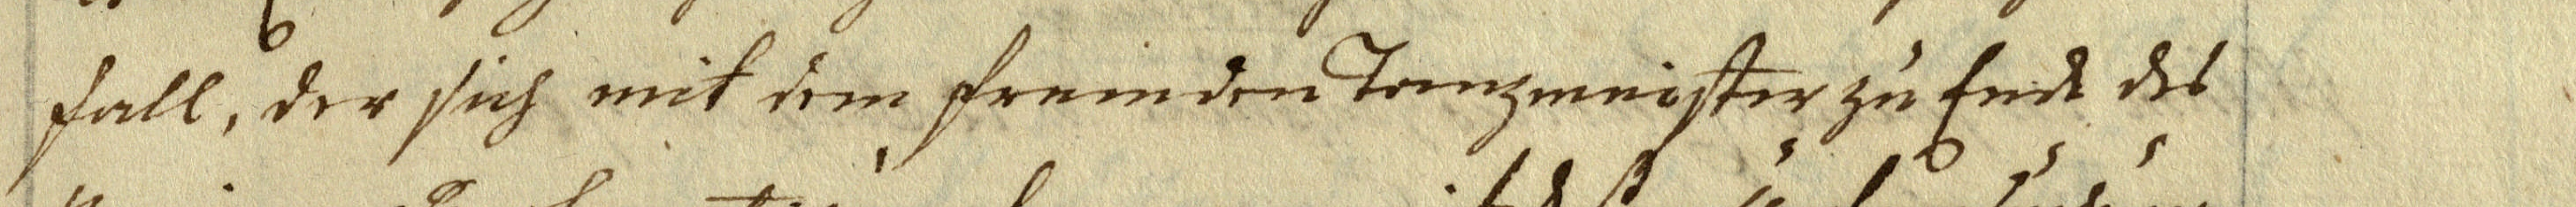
fall, der sich mit dem fremden Tanzmeister zu Ende des
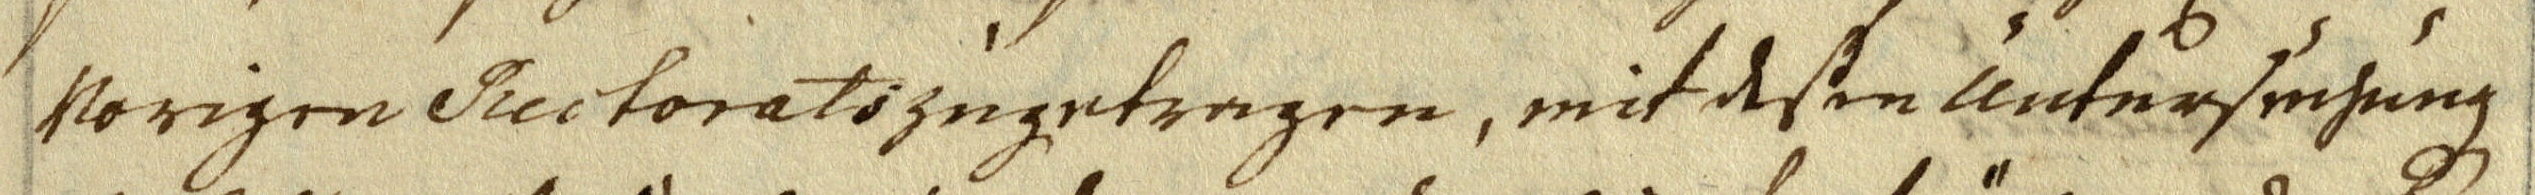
vorigen Rectorats zugetragen, mit dessen Untersuchung
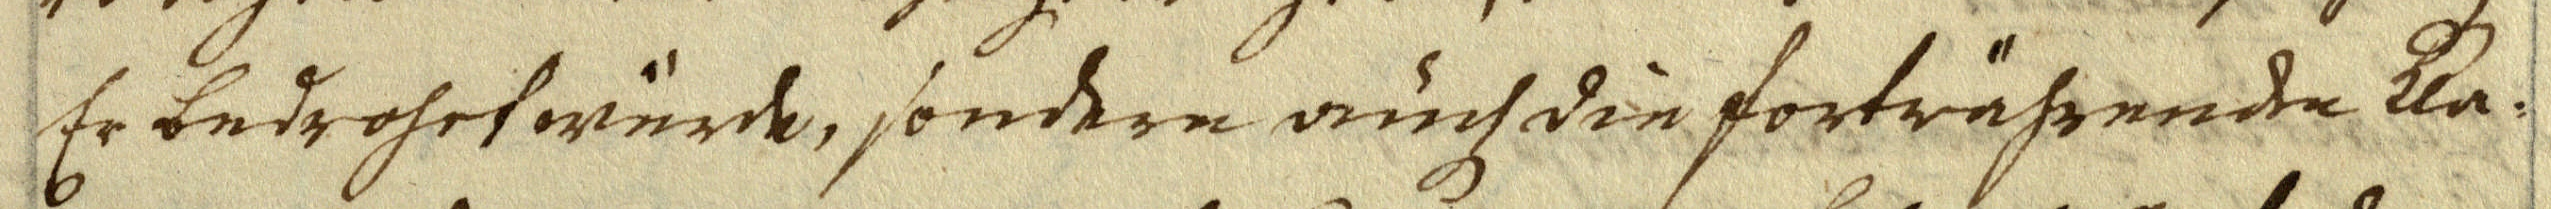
Er bedrohet würde, sondern auch die fortwährenden Kla¬
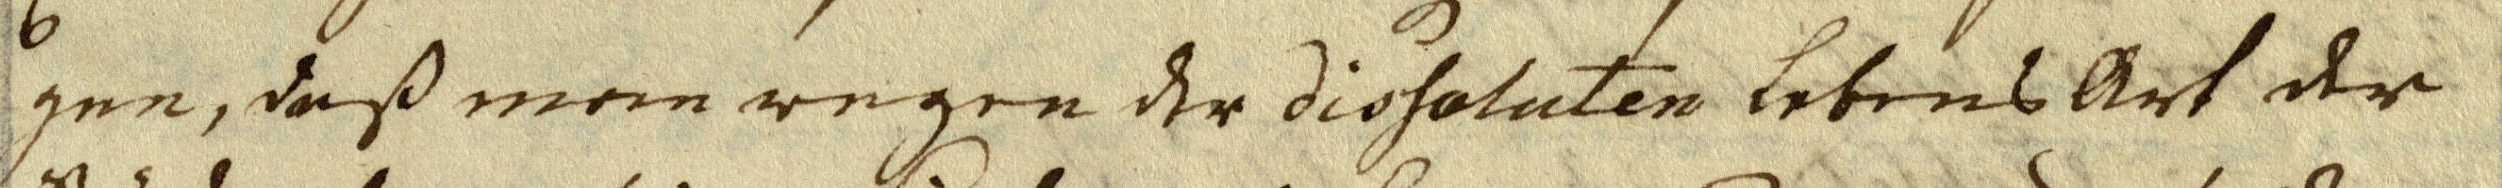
gen, daß man wegen der dissoluten Lebens Art der
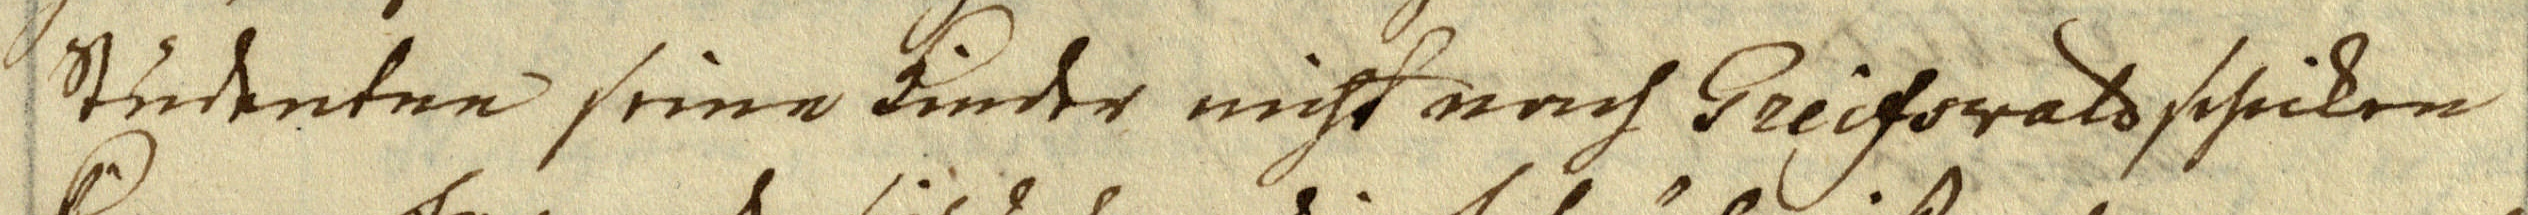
Studenten seine Kinder nicht nach Greifswald schicken
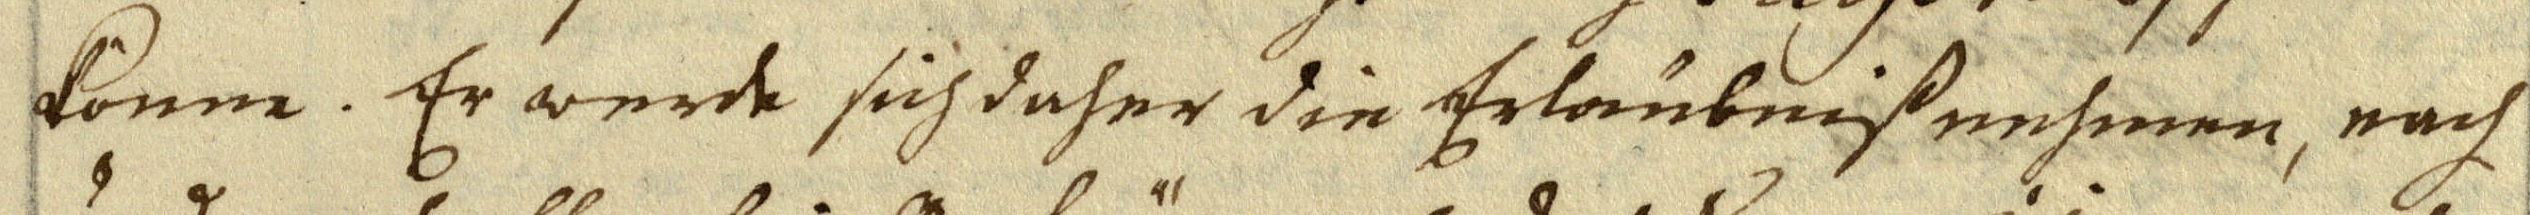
könne. Er werde sich daher die Erlaubniß nehmen, nach
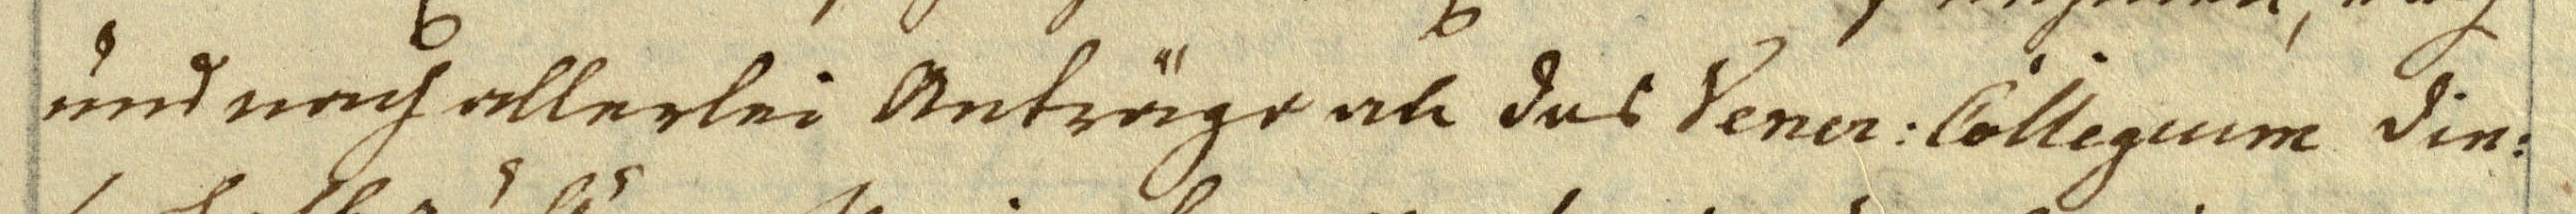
und nach allerlei Anträge an das Vener: Collegium die¬
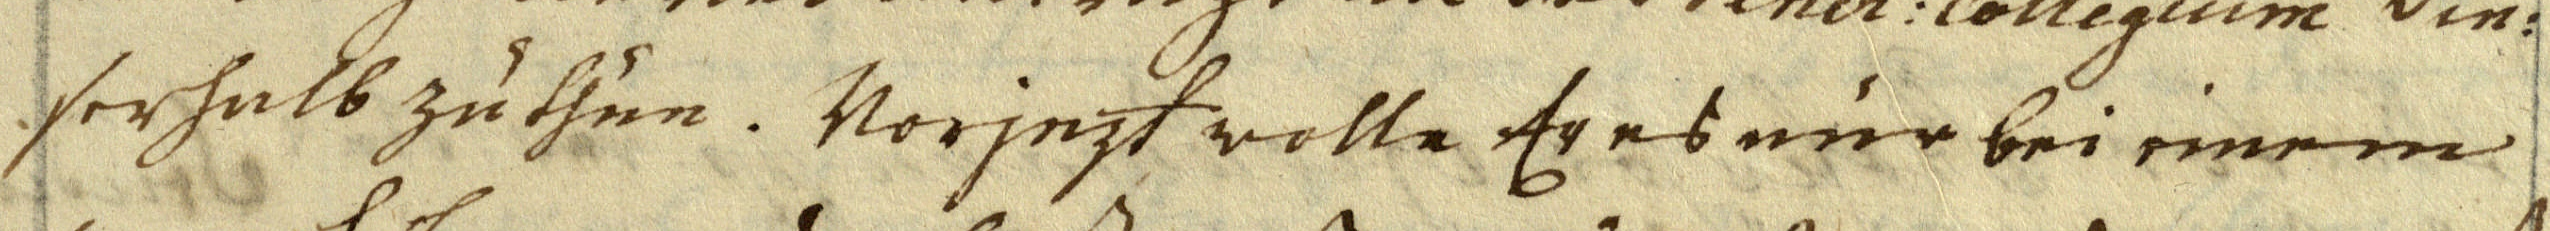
serhalb zu thun. Vorjezt wole Er es nur bei einem
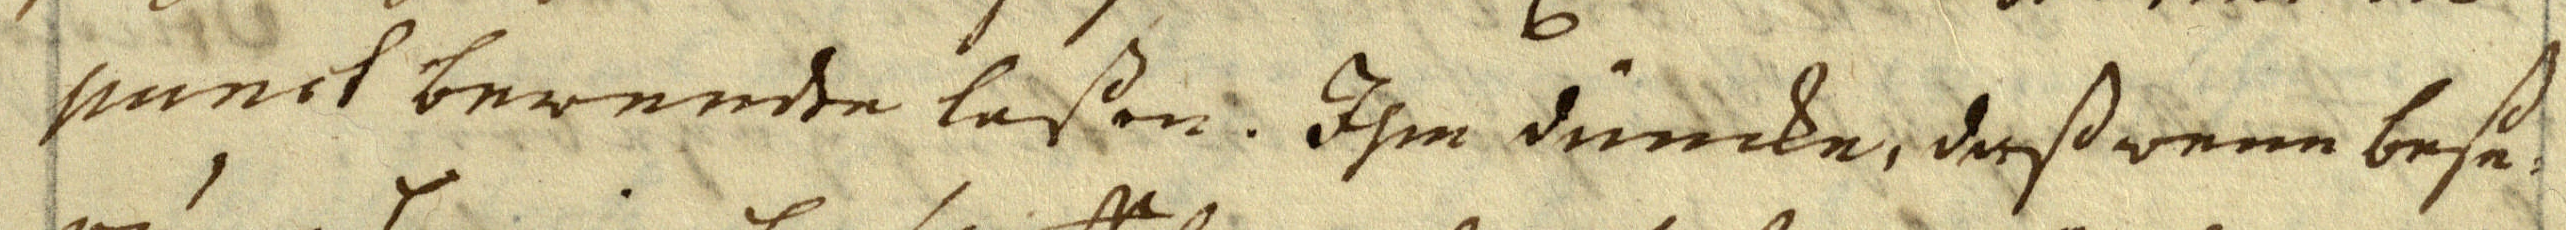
punct bewenden laßen. Ihm düncke, daß wenn beße¬
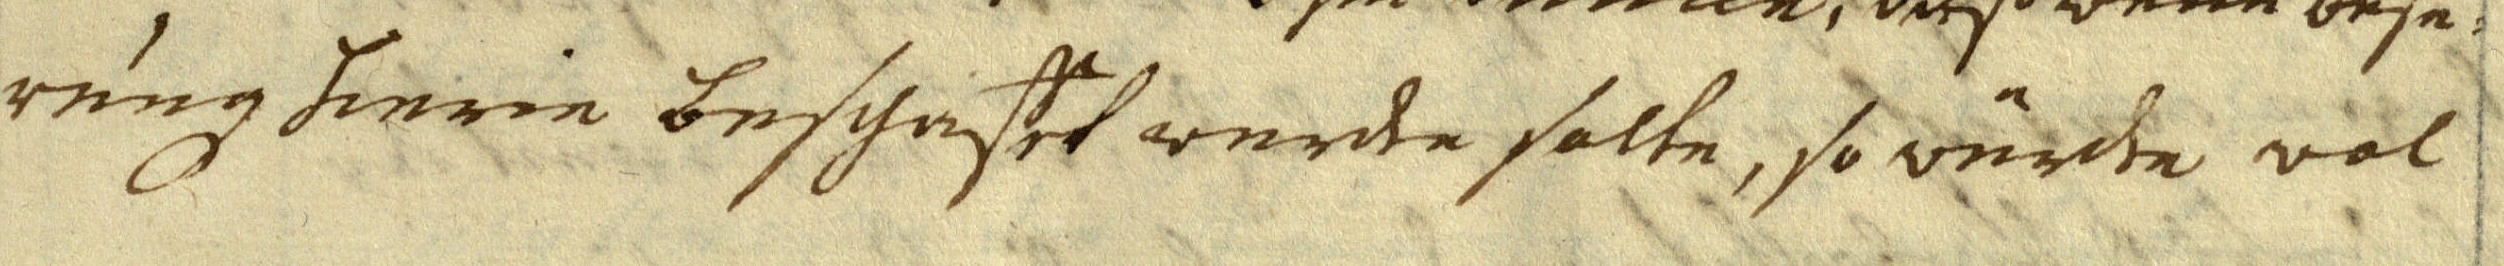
rung hierin beschaffet werden solte, so würde wol
